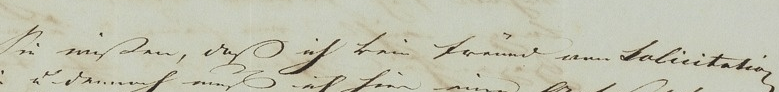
Sie wißen, daß ich kein Freund von Solicitationen
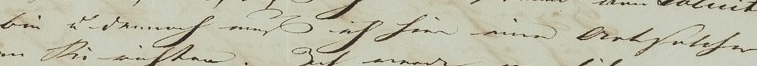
bin u. dennoch muß ich hier eine Art solcher
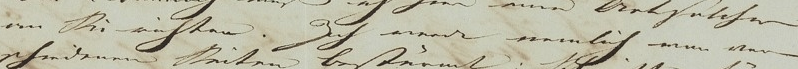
an Sie richten. Ich werde nemlich von ver-
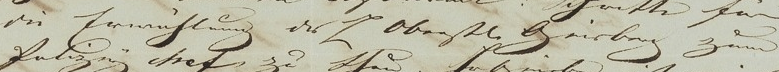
die Erwählung des Herrn Oberst Ginsberg zum
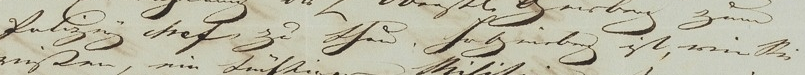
Polizey chef zu thun. Hr Ginsberg ist, wie Sie
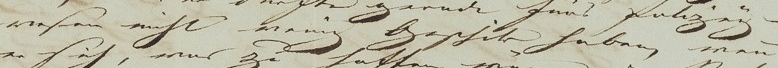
wesen nicht wenig Geschik haben, wenn
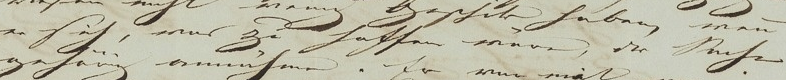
er sich, was zu hoffen wäre, der Sache
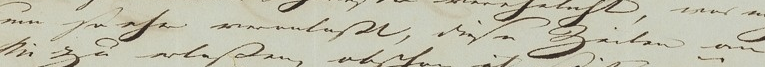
um so eher veranlaßt, diese Zeilen an
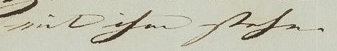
mit ihm stehe.
